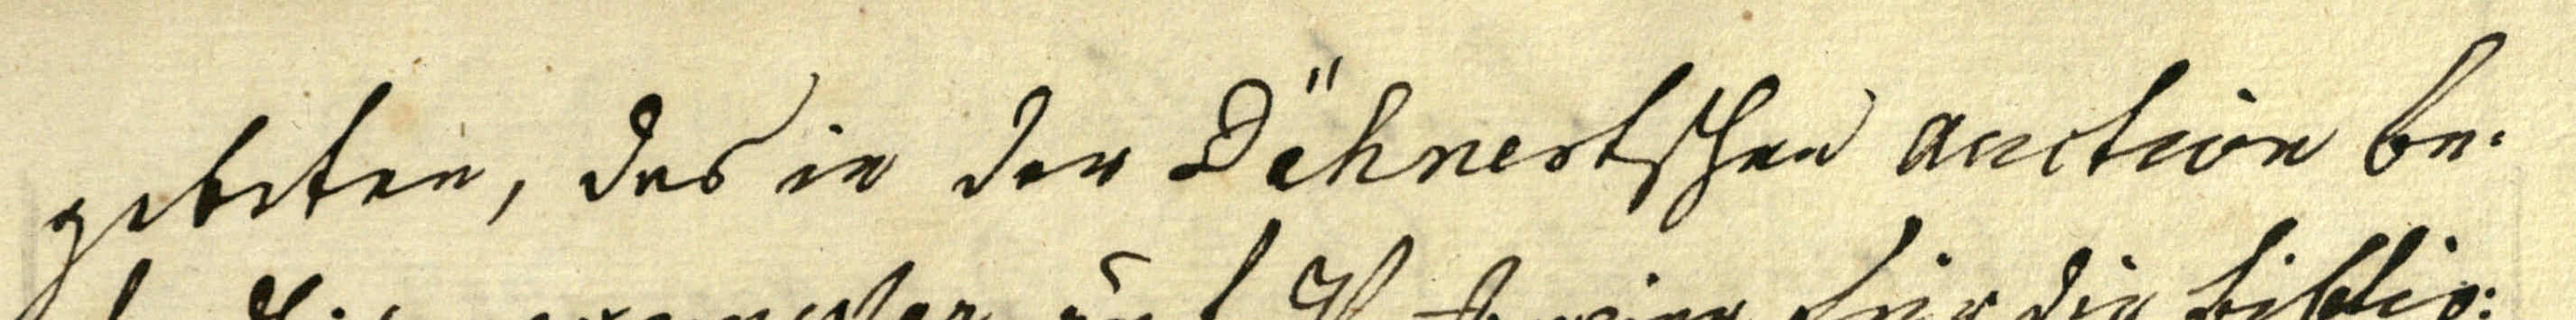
gebeten, das in der Dähnertschen Auction be¬
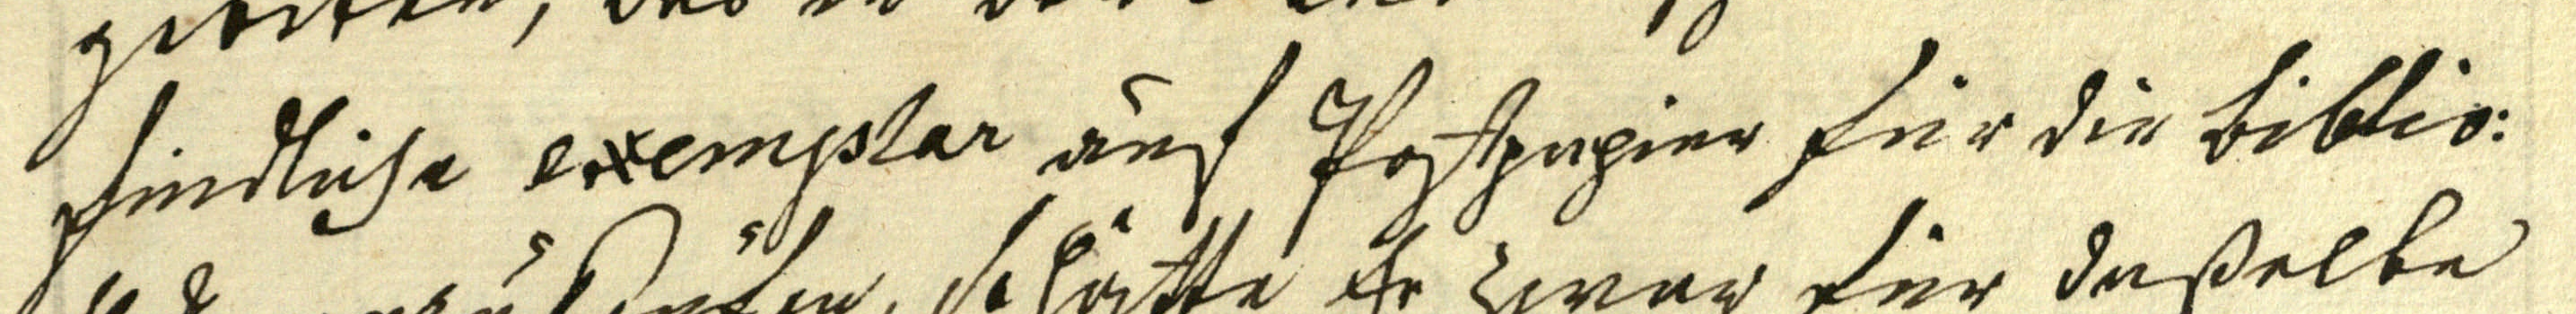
findliche exemplar auf Postpapier für die Biblio¬
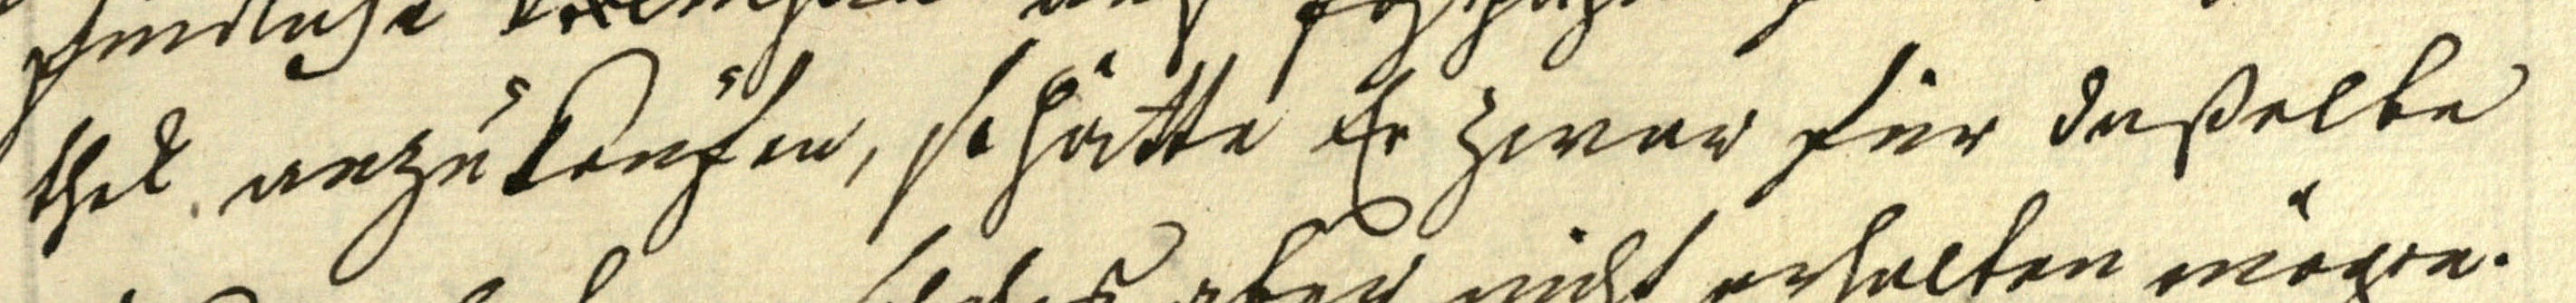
thek anzukaufen, so hätte Er zwar für daßelbe
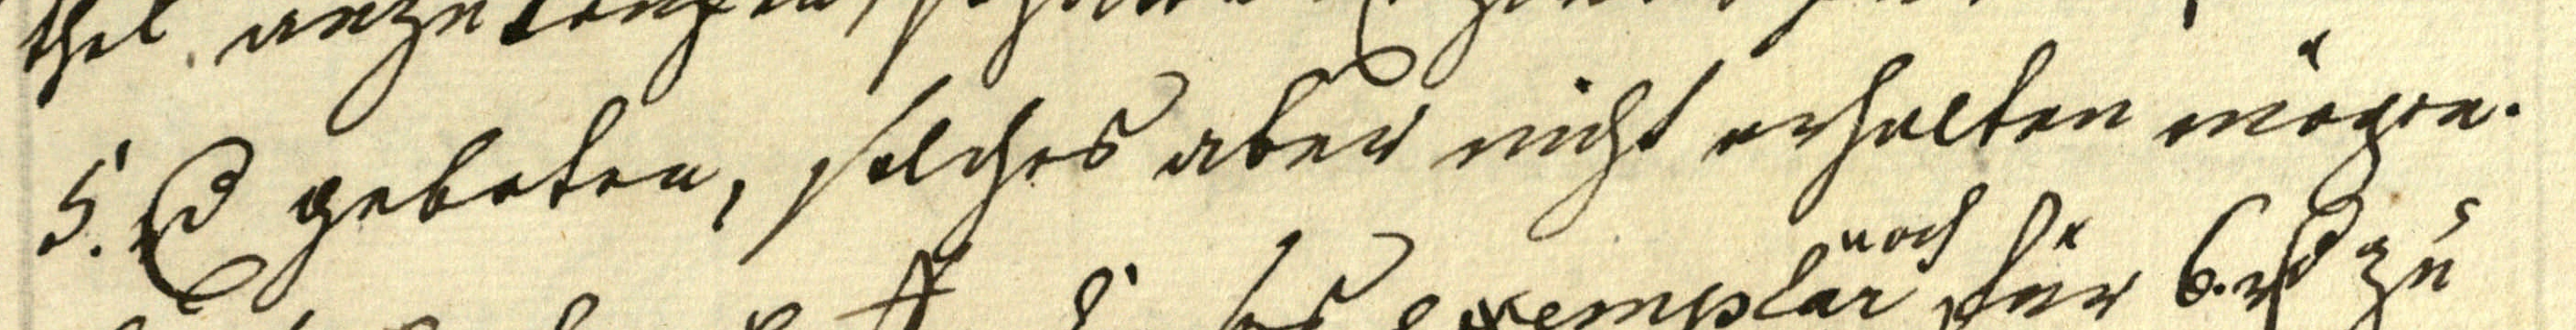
5. rt geboten, solches aber nicht erhalten mögen.
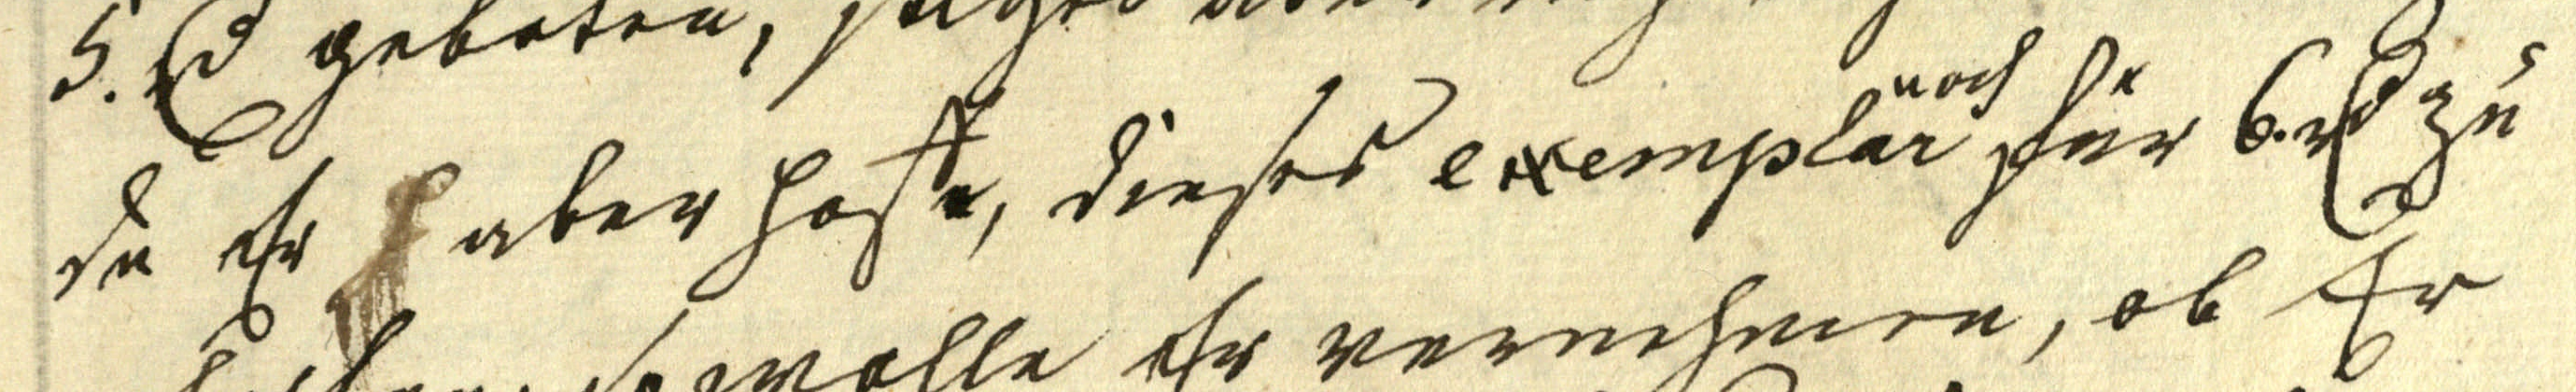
da Er h aber hoffe, dieses exemplar noch für 6 rt zu
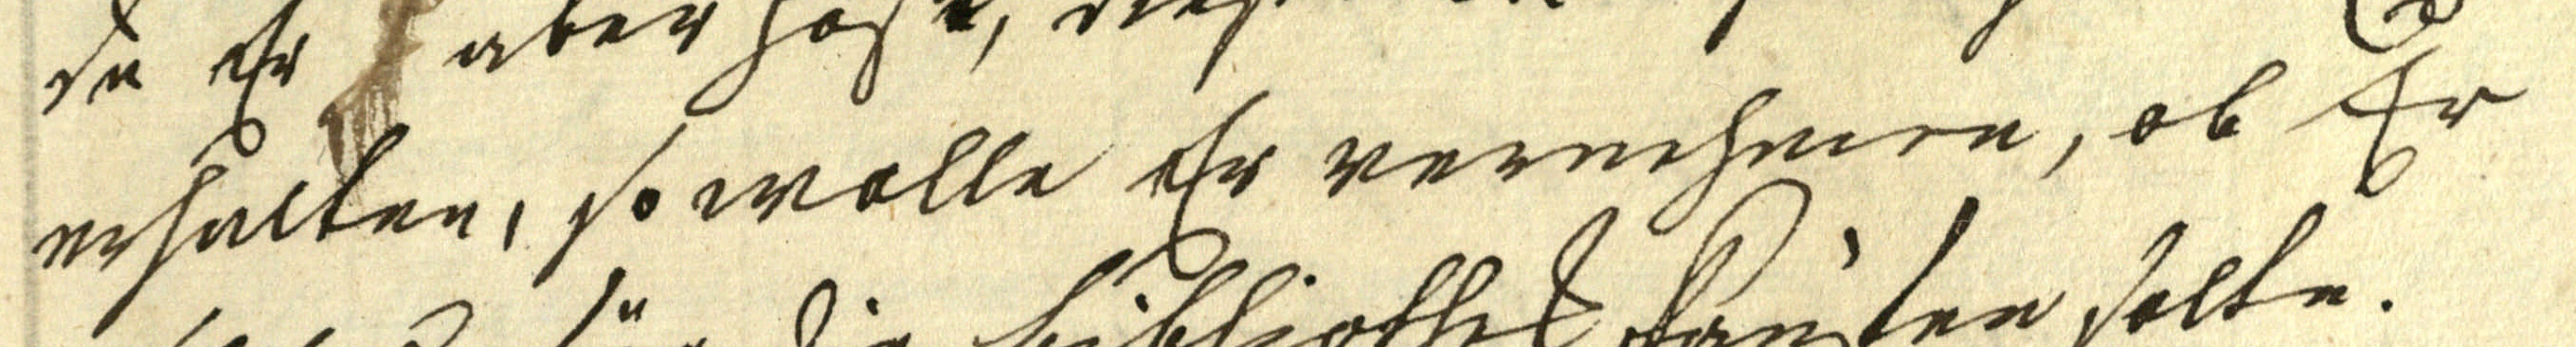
erhalten, so wolle Er vernehmen, ob Er
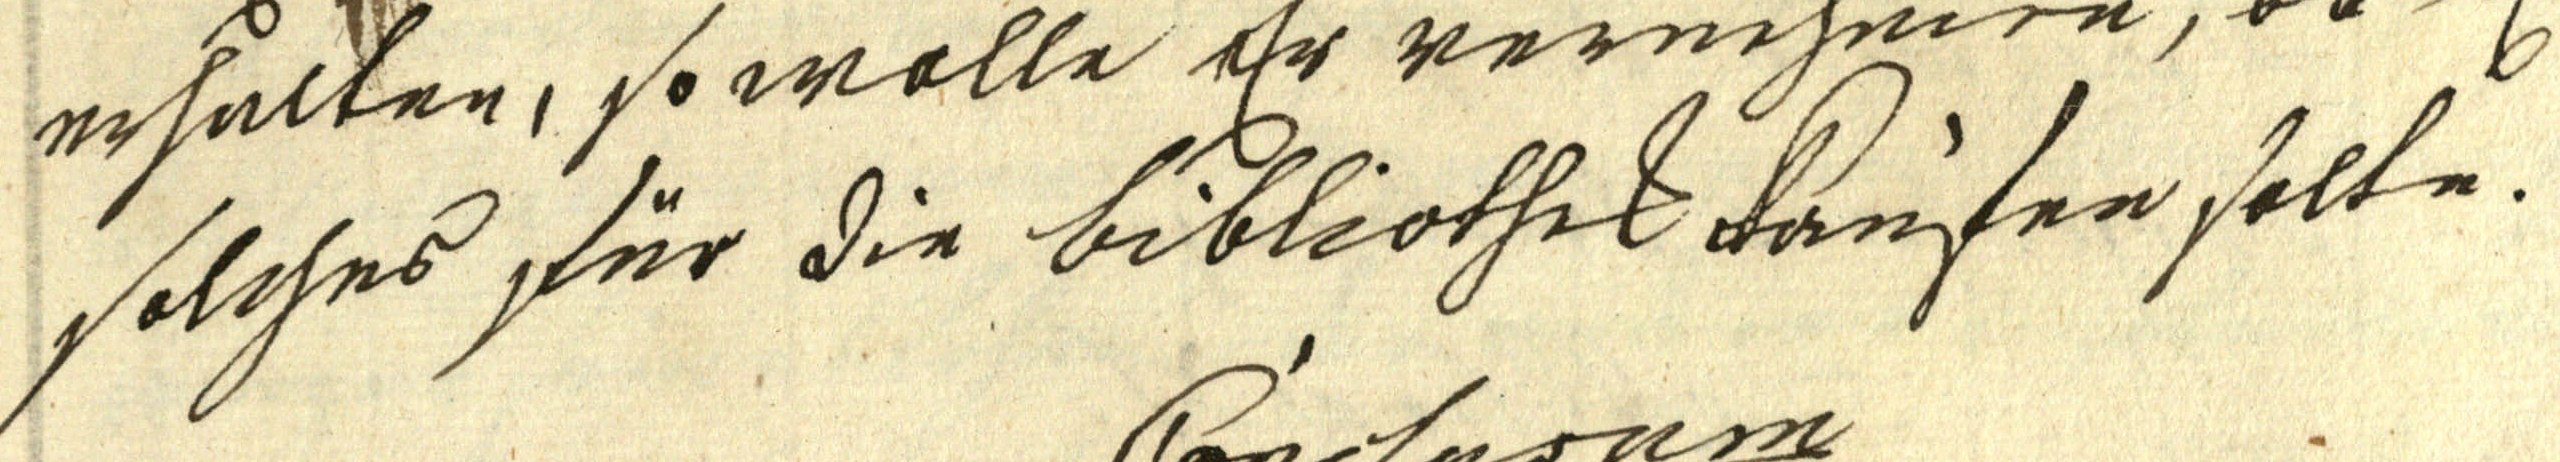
solches für die Bibliothek kaufen solte.
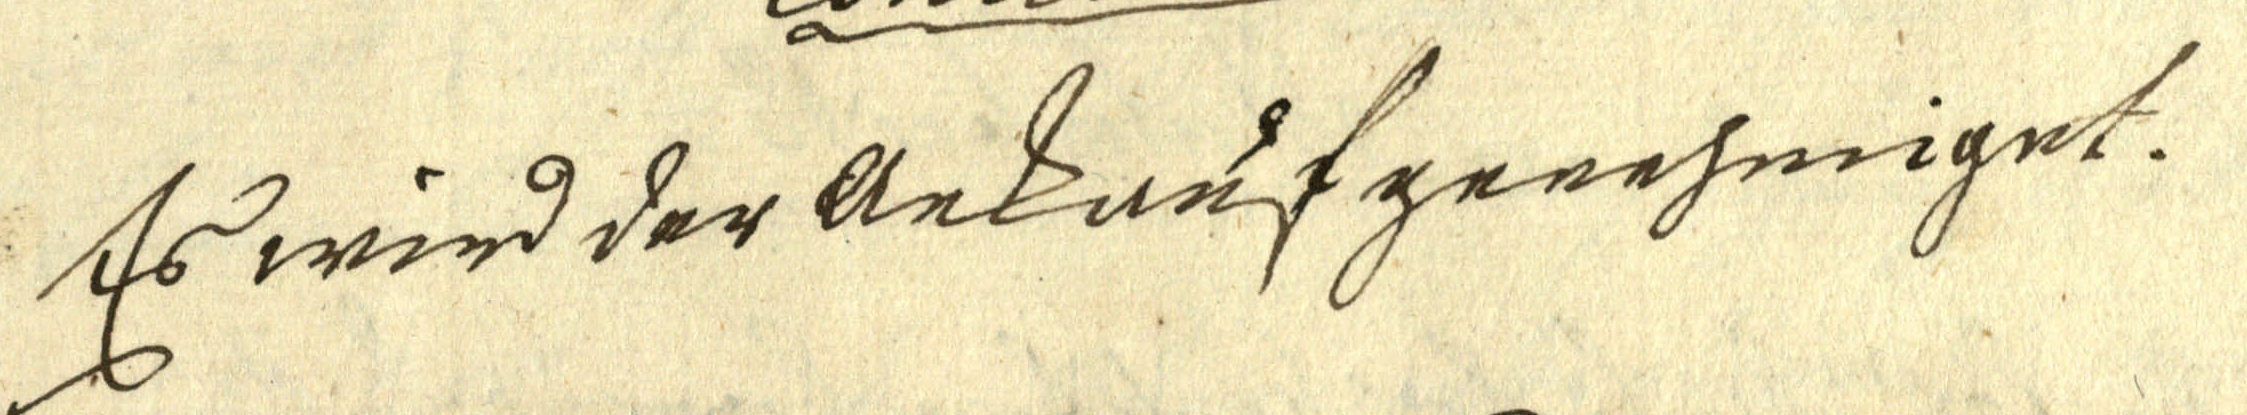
Es wird der Ankauf genehmiget.
